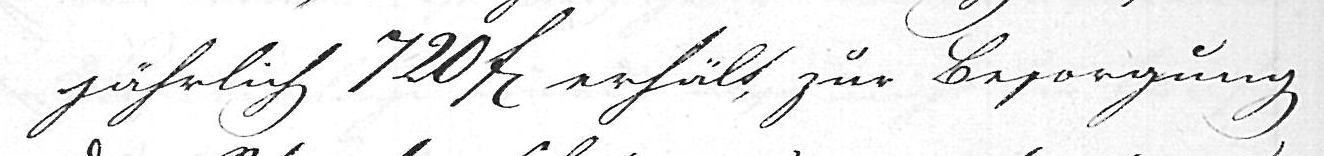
jährlich 720 fl erhält, zur Besorgung
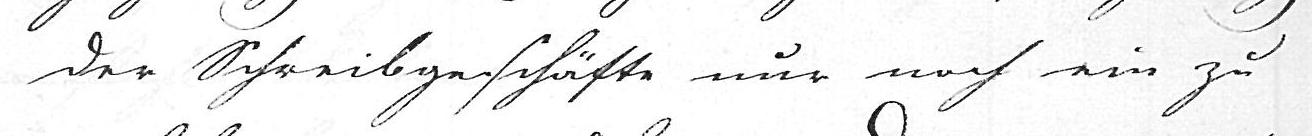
der Schreibgeschäfte nur noch ein zu
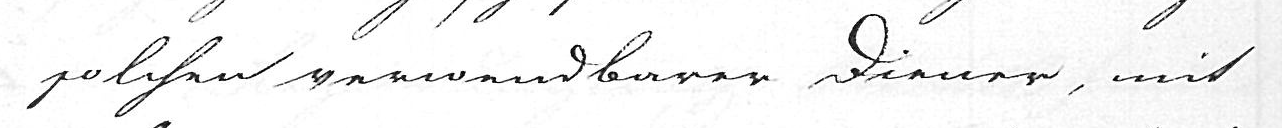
solchen verwendbaren Diener, mit
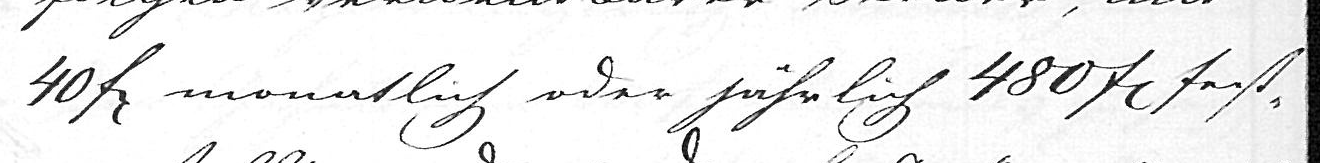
40 fl monatlich oder jährlich 480 fl fest-
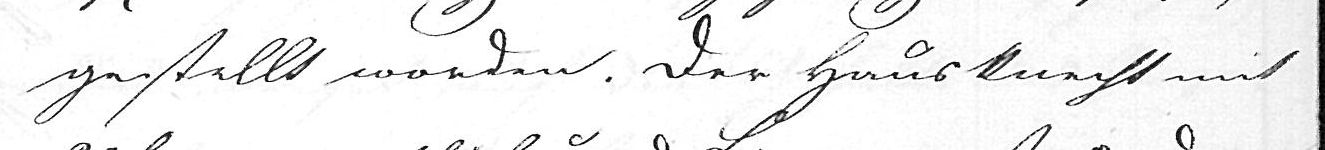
gestellt worden. Der Hausknecht mit
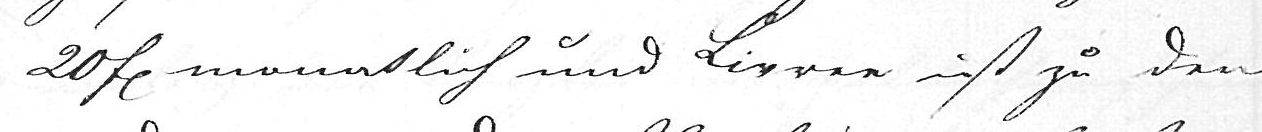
20 fl monatlich und Livree ist zu den
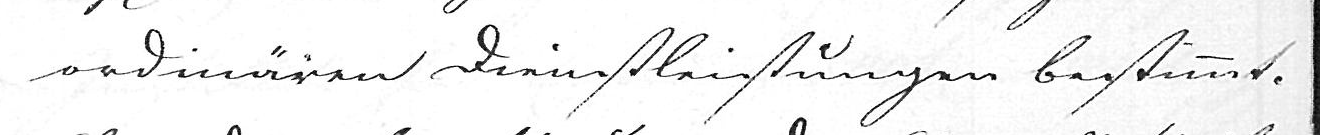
ordinären Dienstleistungen bestimmt.
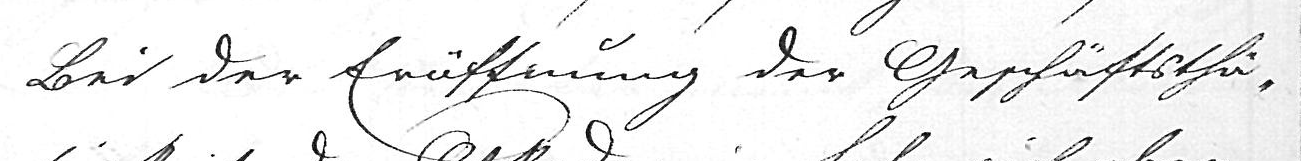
Bei der Eröffnung der Geschäftsthä-
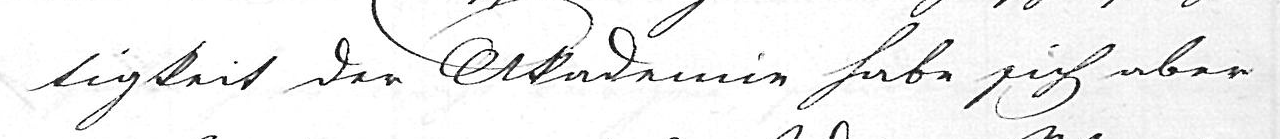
tigkeit der Akademie habe sich aber
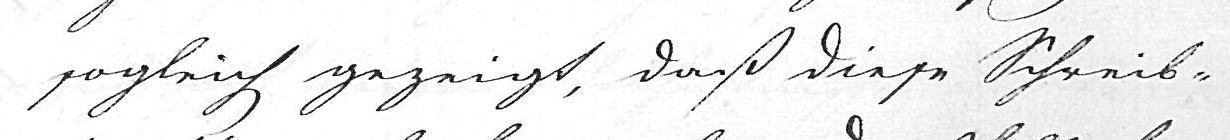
sogleich gezeigt, daß diese Schreib-
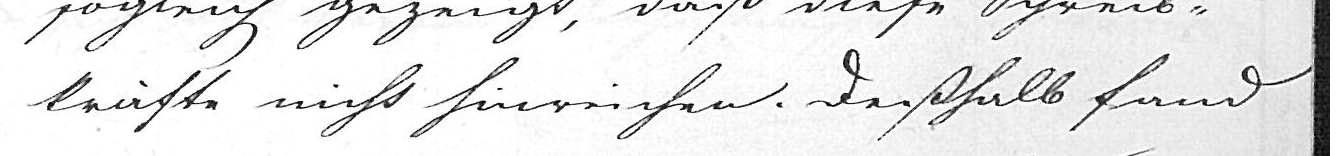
kräfte nicht hinreichen. Deßhalb fand
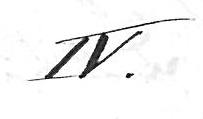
III.
